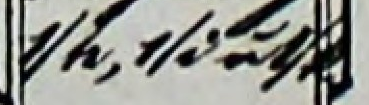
1/h, 1/d u 1/k
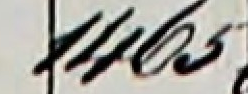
1465
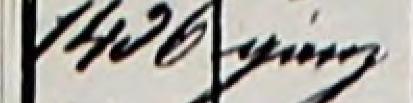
1436 ganz
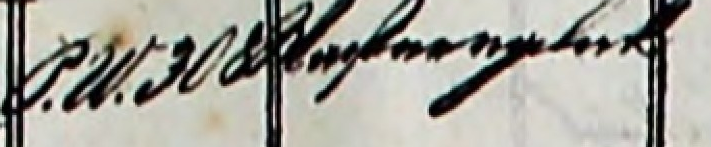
P.W. 308 Wastrengelak
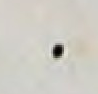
.
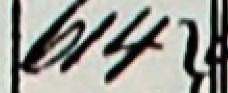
641
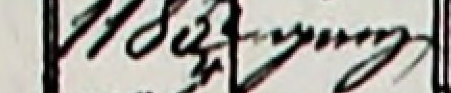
1185 1/4 ganz
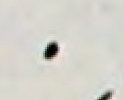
„
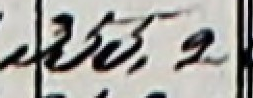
355,2
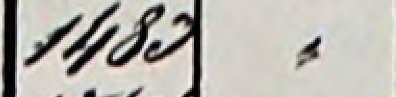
1483 „
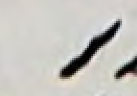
1
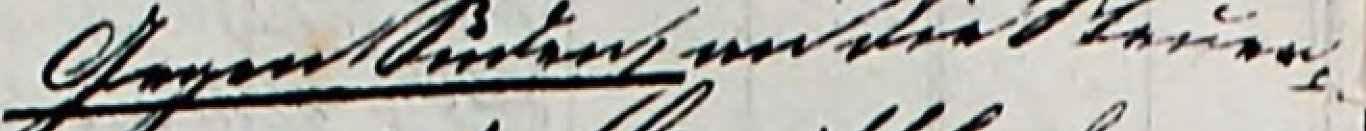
Gegen Süden, an die Steuer„
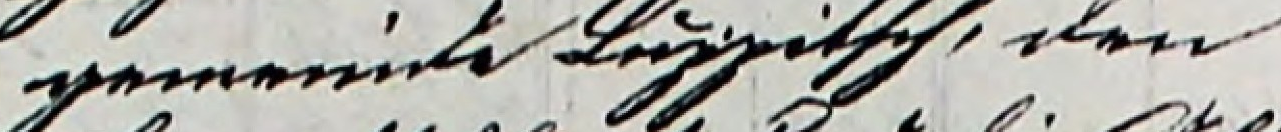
gemeinde Luppitsch, den
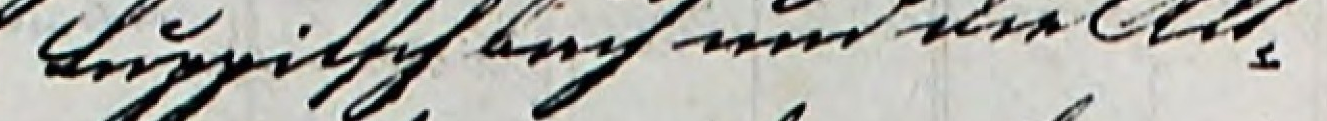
Luppitsch bach und die Alt„
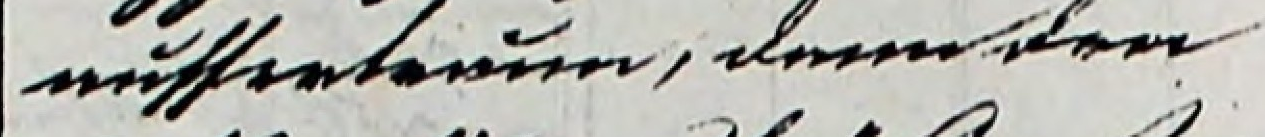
auffertraun, dann den
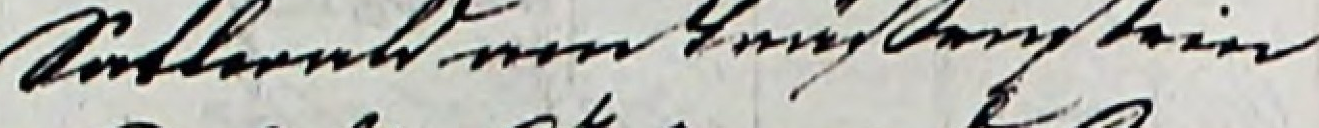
Satlerald von Träßenstein
